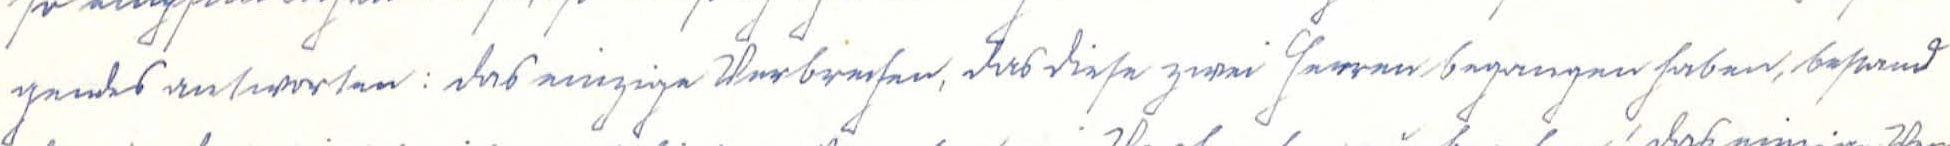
gendes antworten: Das einzige Verbrechen, das diese zwei Herren begangen haben, bestand
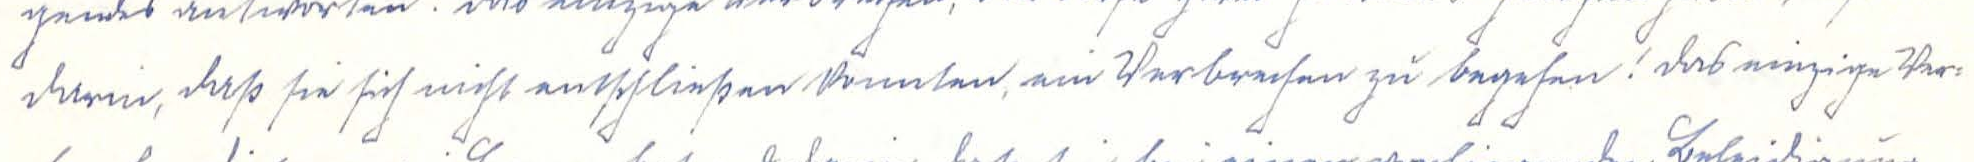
darin, daß sie sich nicht entschließen konnten, ein Verbrechen zu begehen! Das einzige Ver-
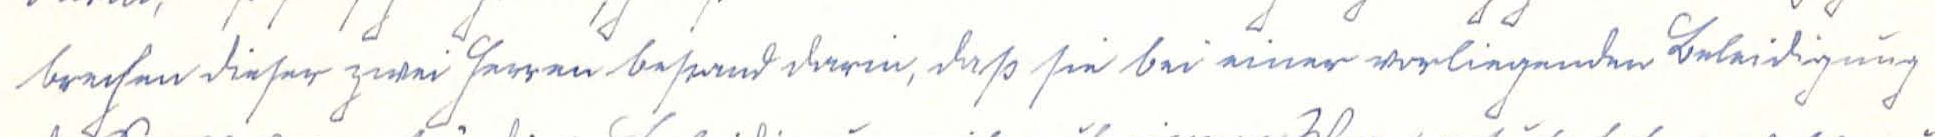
brechen dieser zwei Herren bestand darin, daß sie bei einer vorliegenden Beleidigung
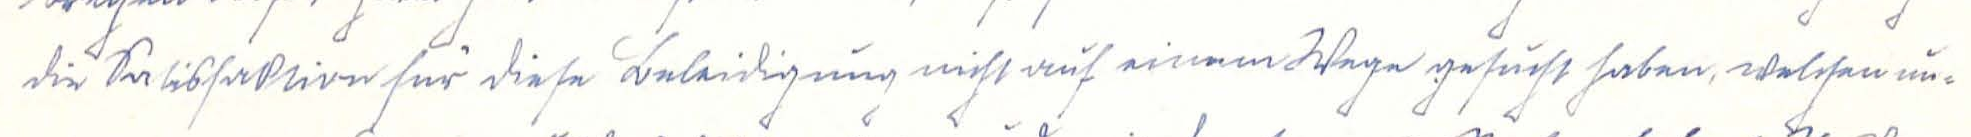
die Satisfaktion für diese Beleidigung nicht auf einem Wege gesucht haben, welcher un-
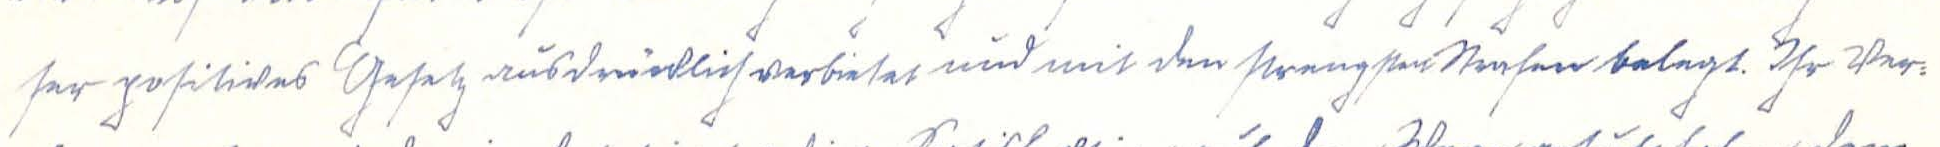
ser politisches Gesetz ausdrücklich verbietet und mit den strengsten Strafen belegt. Ihr Ver-
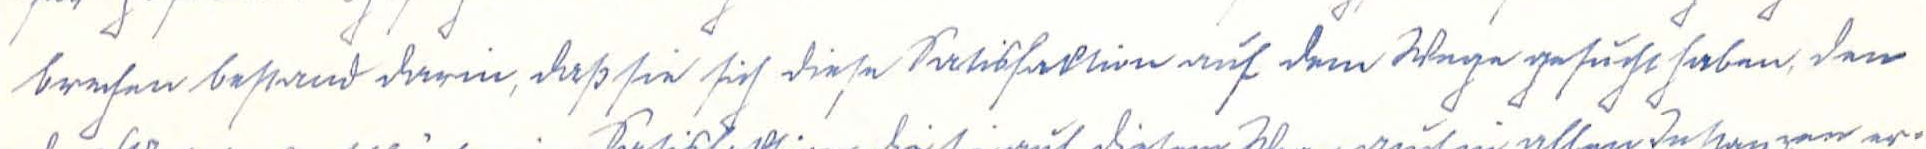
brechen bestand darin, daß sie sich diese Satisfaktion auf dem Wege gesucht haben, den
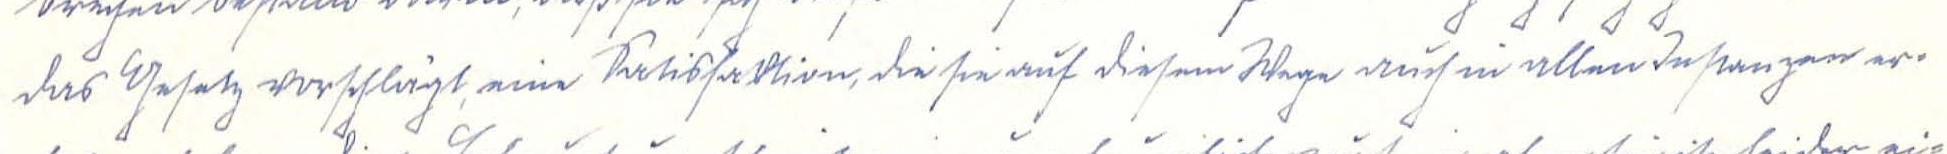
das Gesetz vorschlägt, eine Satisfaktion, die sie auf diesem Wege auch in allen Instanzen er-
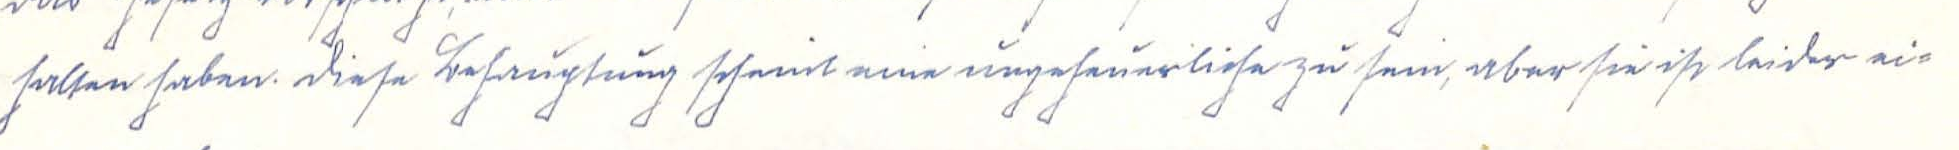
halten haben. Diese Behauptung scheint eine ungeheuerliche zu sein, aber sie ist leider ei-
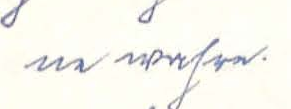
ne wahre:
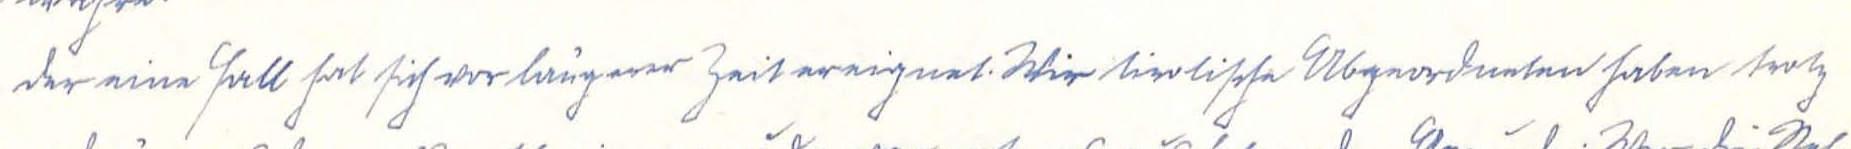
Der eine Fall hat sich vor längerer Zeit ereignet. Wir tirolische Abgeordneten haben trotz
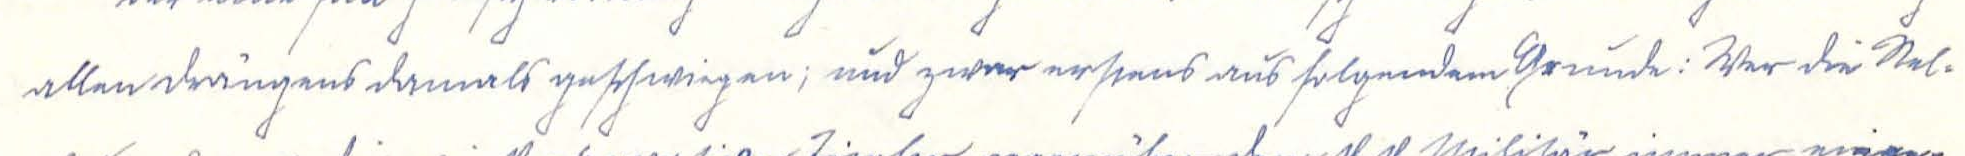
allen Drängens damals geschwiegen; und zwar erstens aus folgendem Grund: Wer die Stel-
